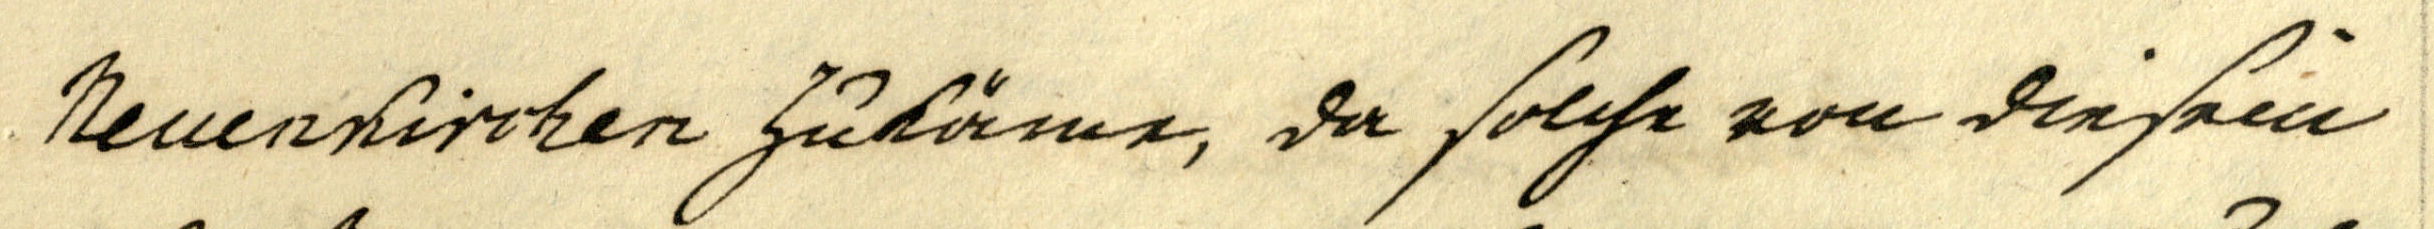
Neuenkirchen zukäme, da solche von diesem
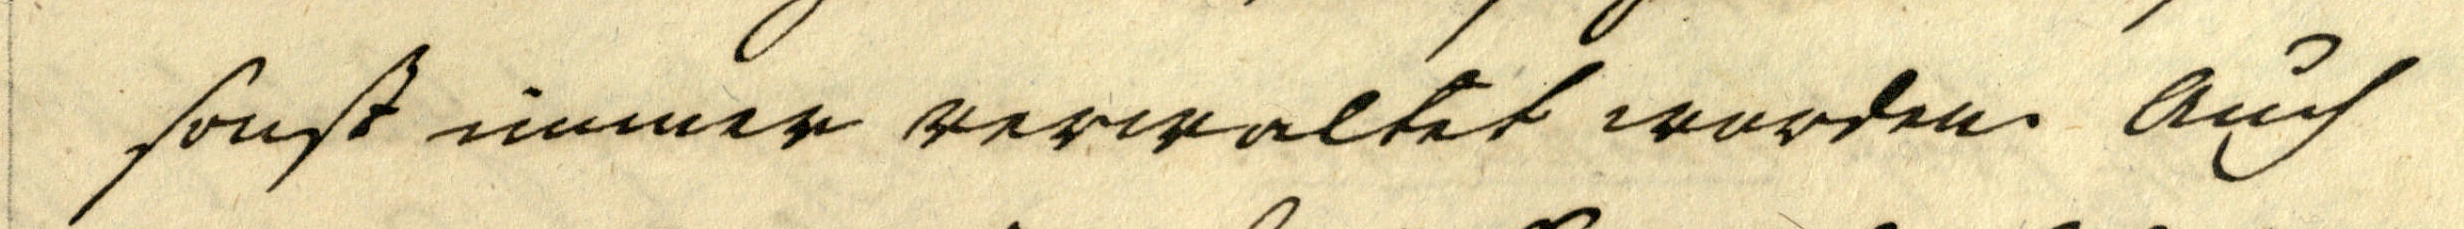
sonst immer verwaltet worden. Auch
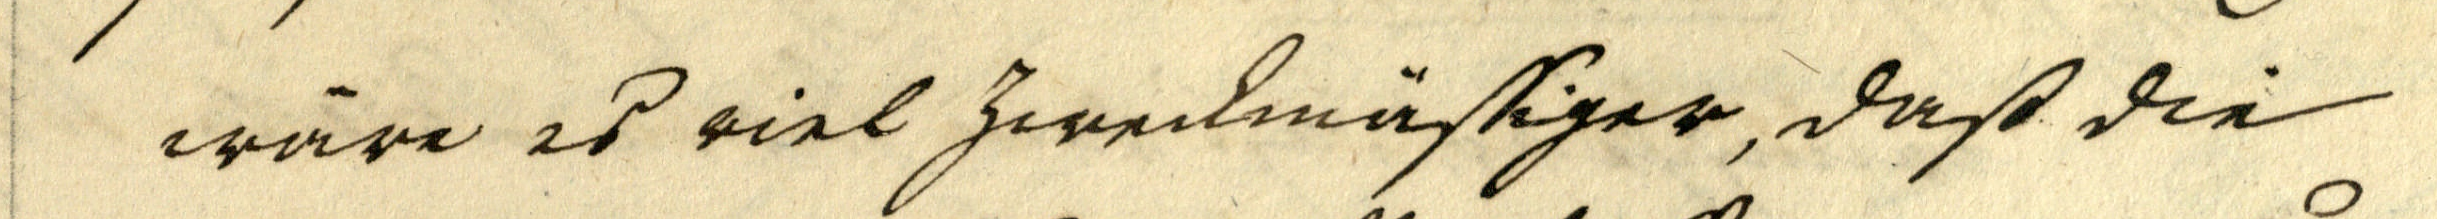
wäre es viel zweckmässiger, daß die
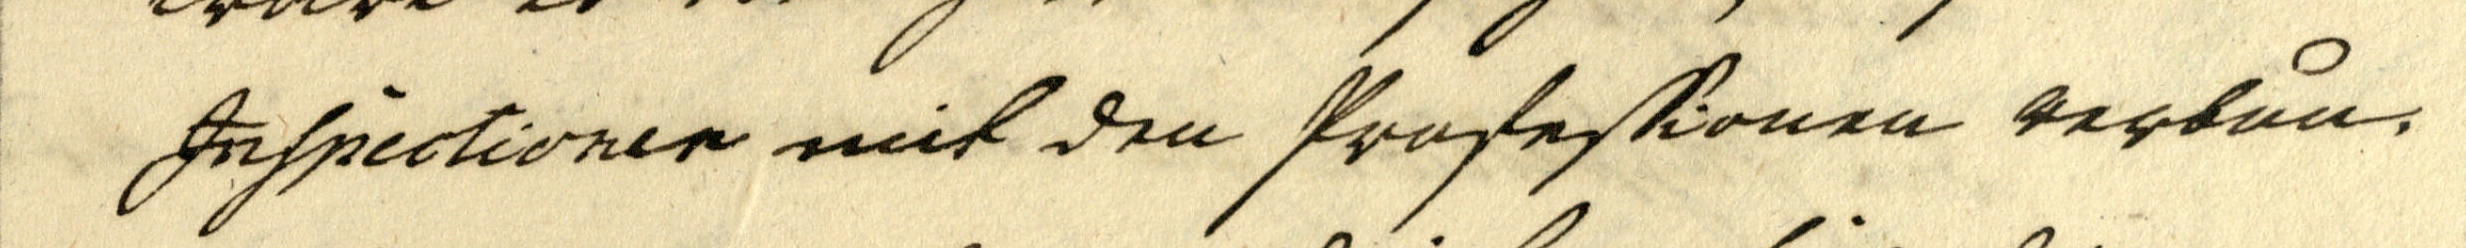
Inspectionen mit den Professionen verbun-
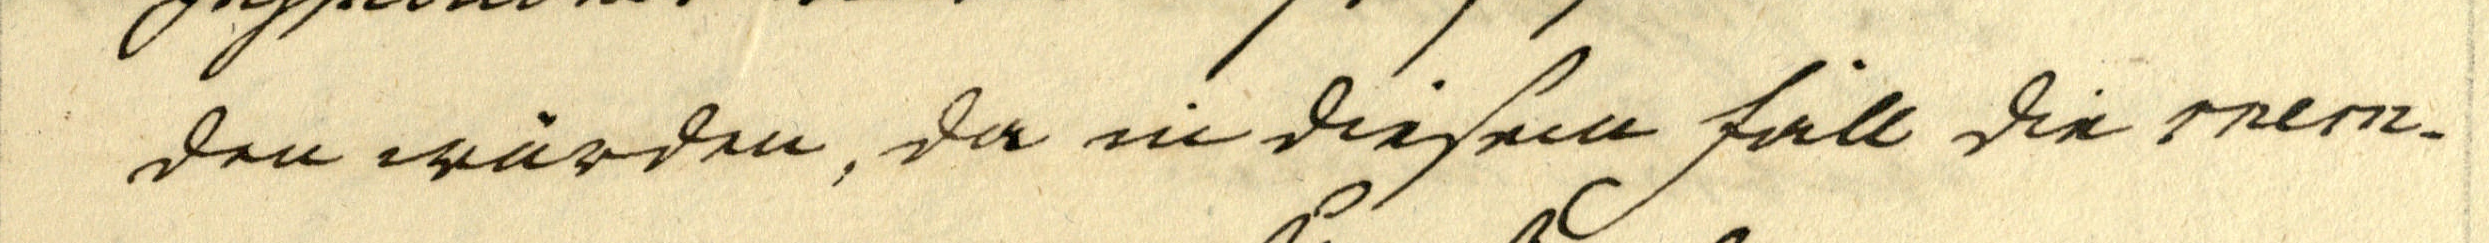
den würden, da in diesem Fall die mem-
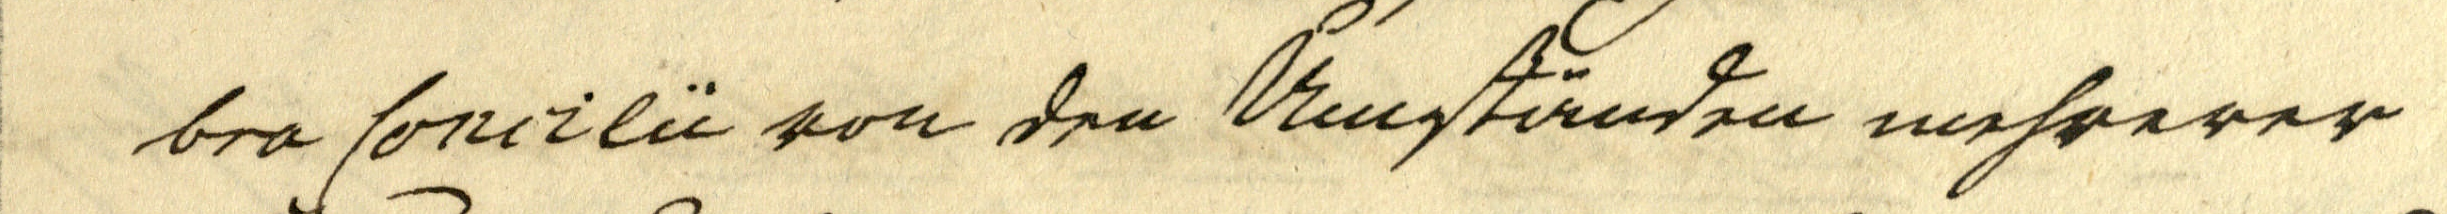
bra Concilii von den Umständen mehrerer
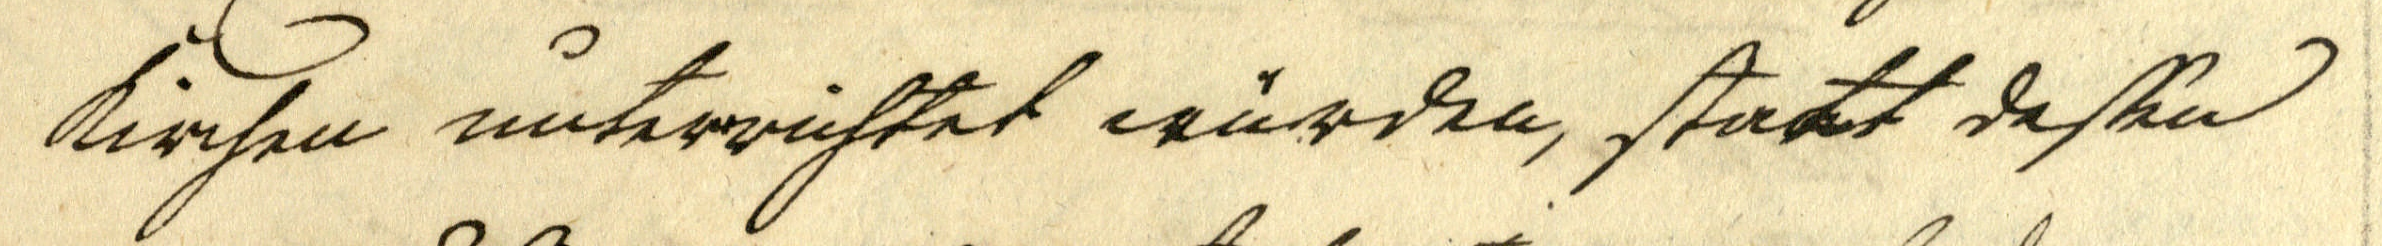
Kirchen unterrichtet würden, statt dessen
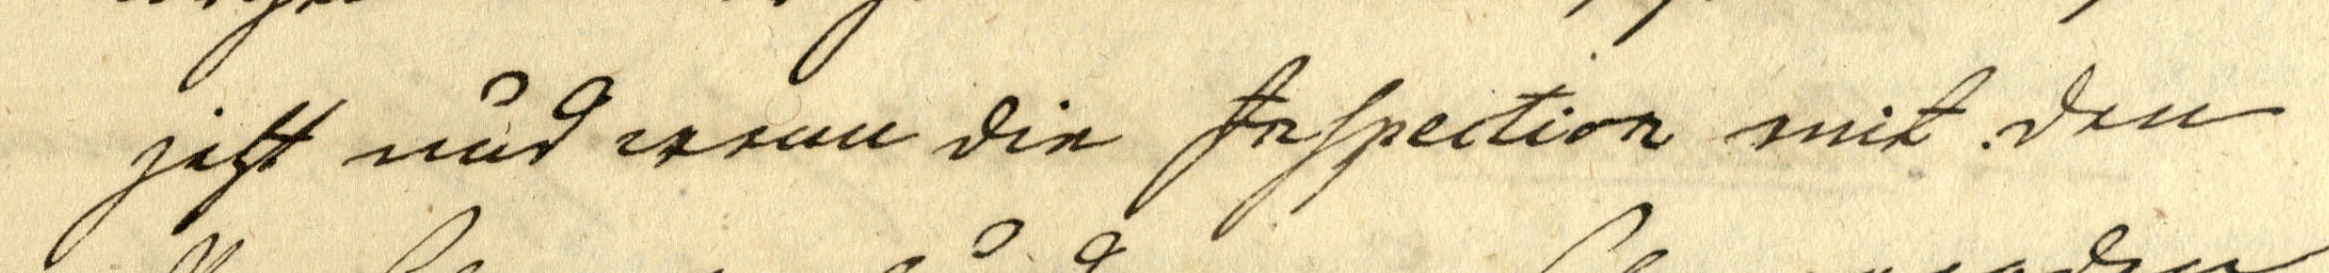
jetzt und wenn die Inspection mit den
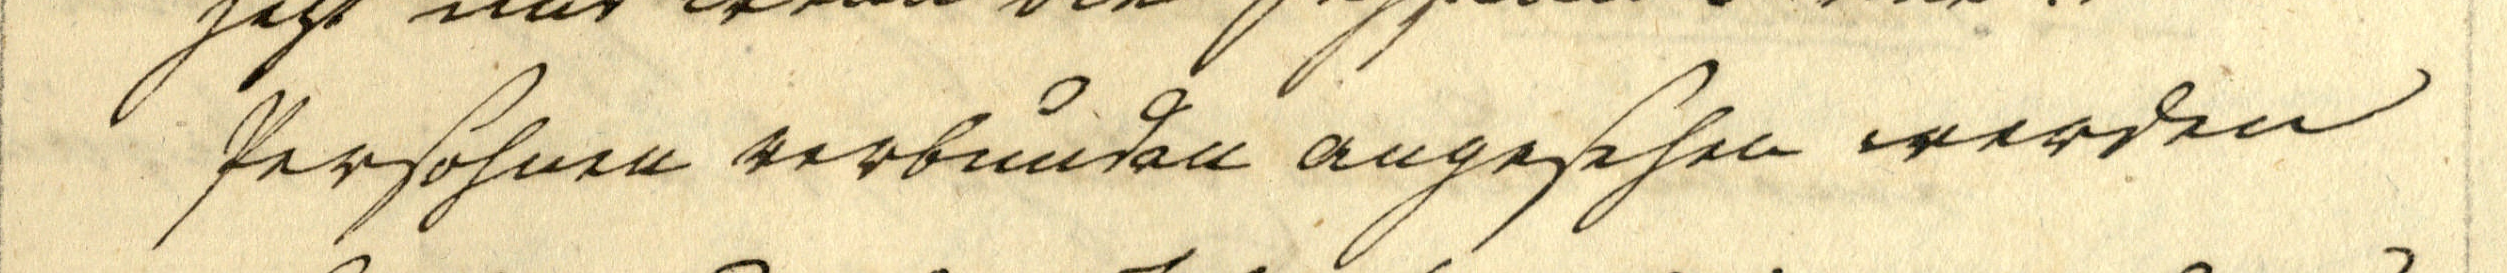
Persohnen verbunden angesehen werden
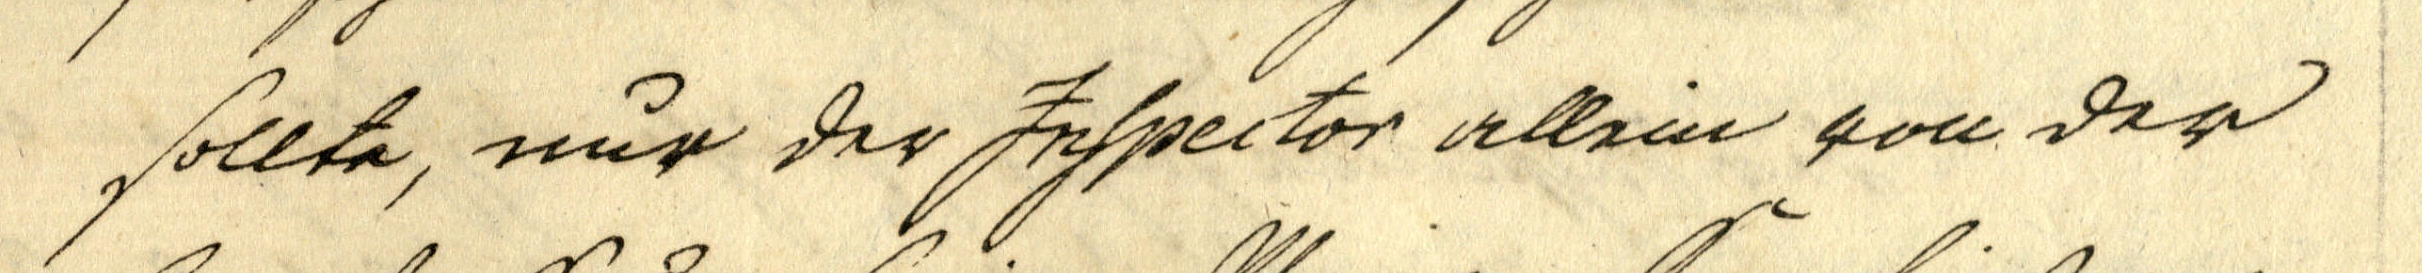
sollte, nur der Inspector alleine von der
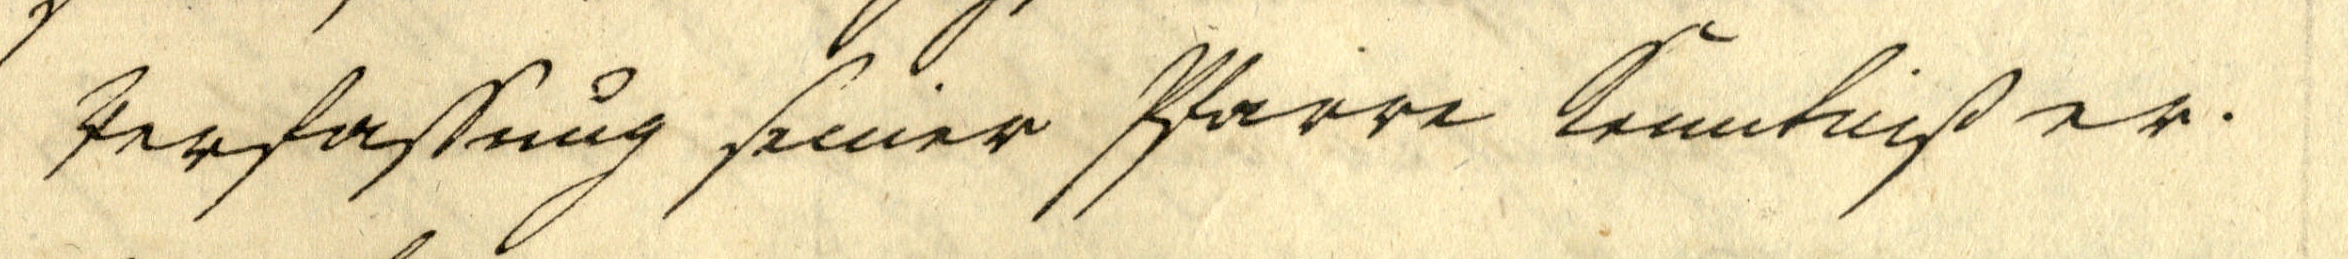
Verfassung seiner Pfare Kenntniß er-
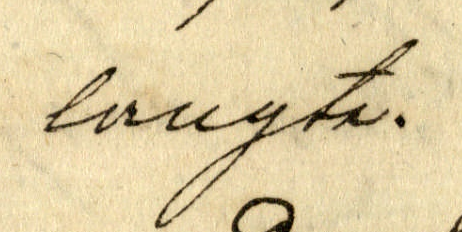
langte.
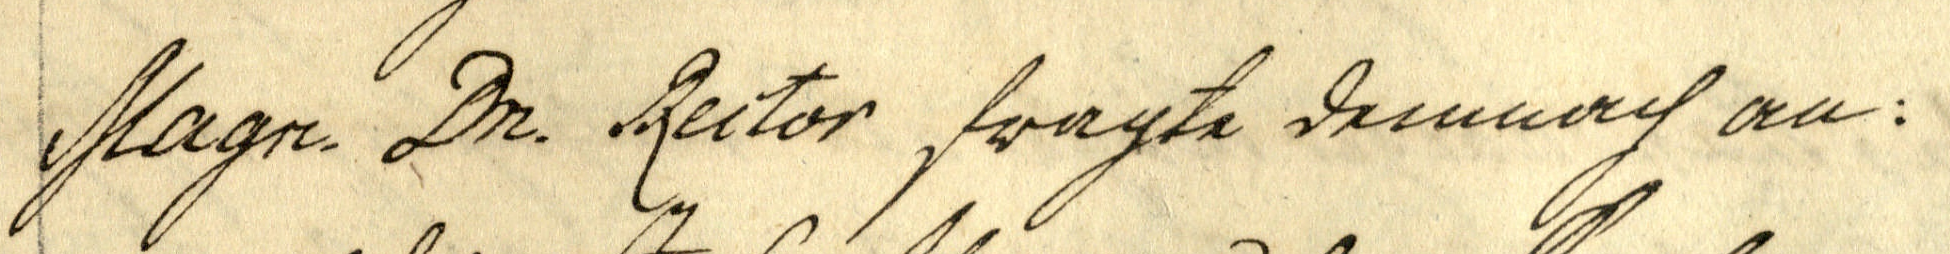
Magn. Dn. Rector fragte demnach an:
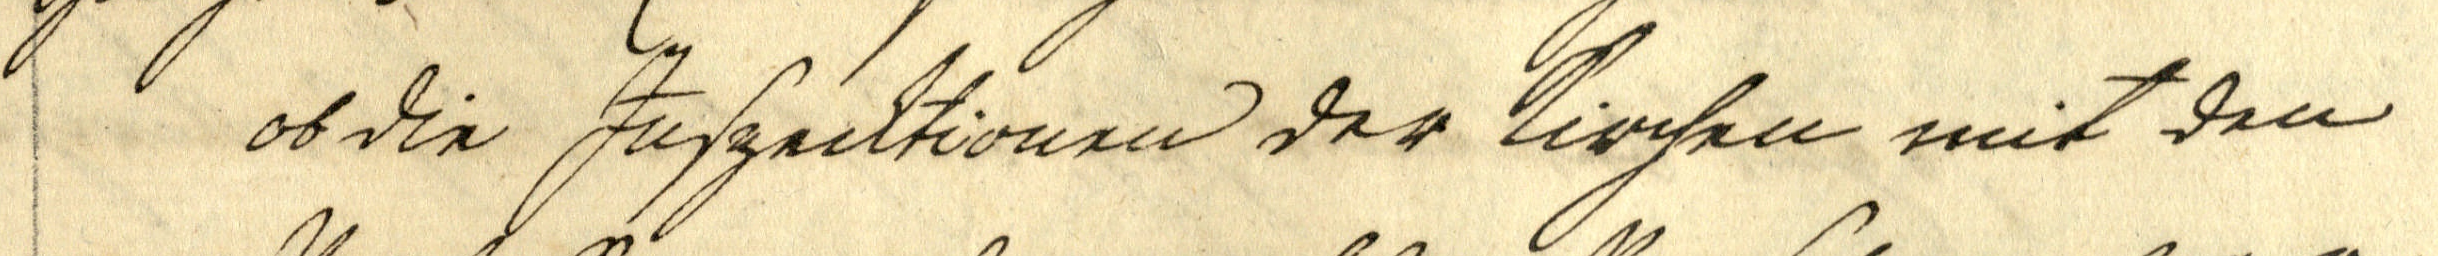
ob die Inspektionen der Kirchen mit den
